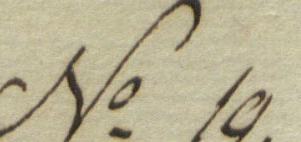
No 19.
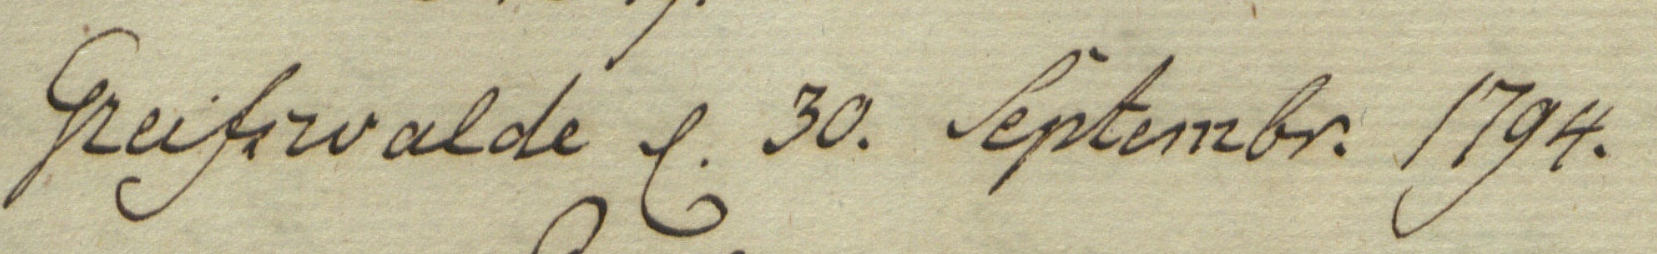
Greifswalde d. 30. Septembr. 1794.
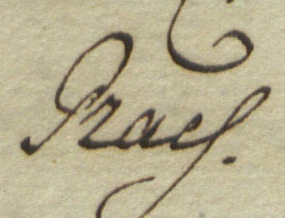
Praes.
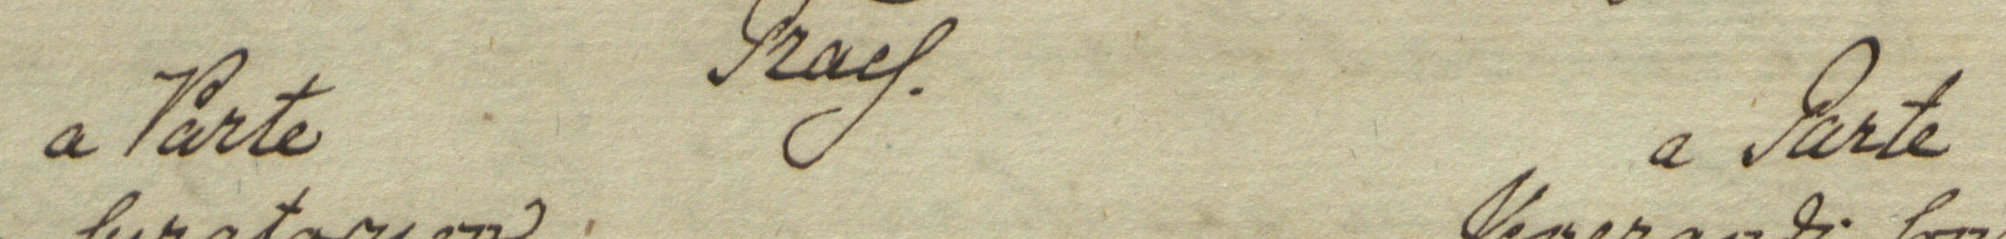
a Parte a Parte
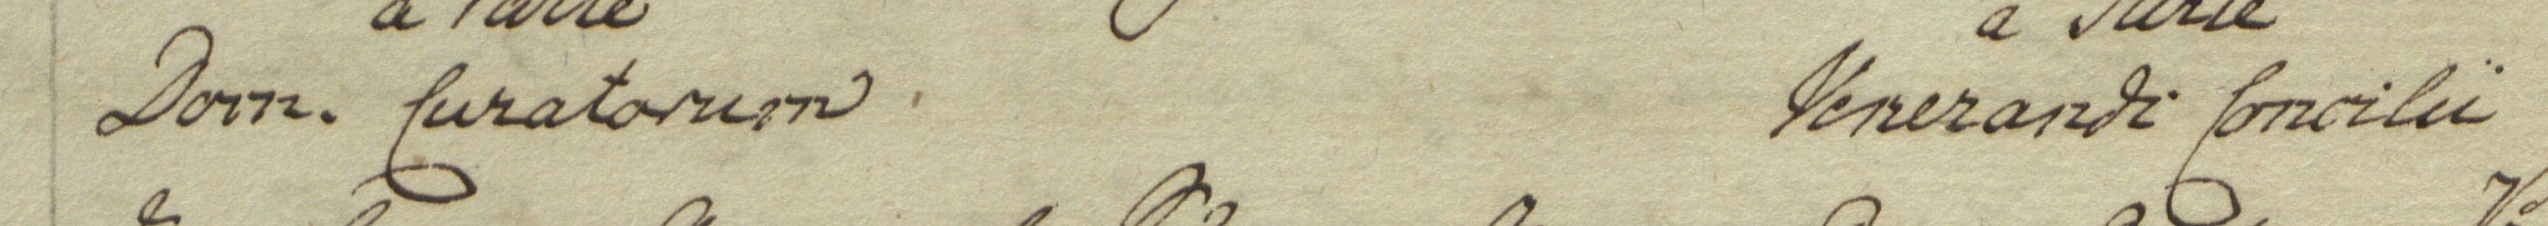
Dom. Curatorum Venerandi Concilii
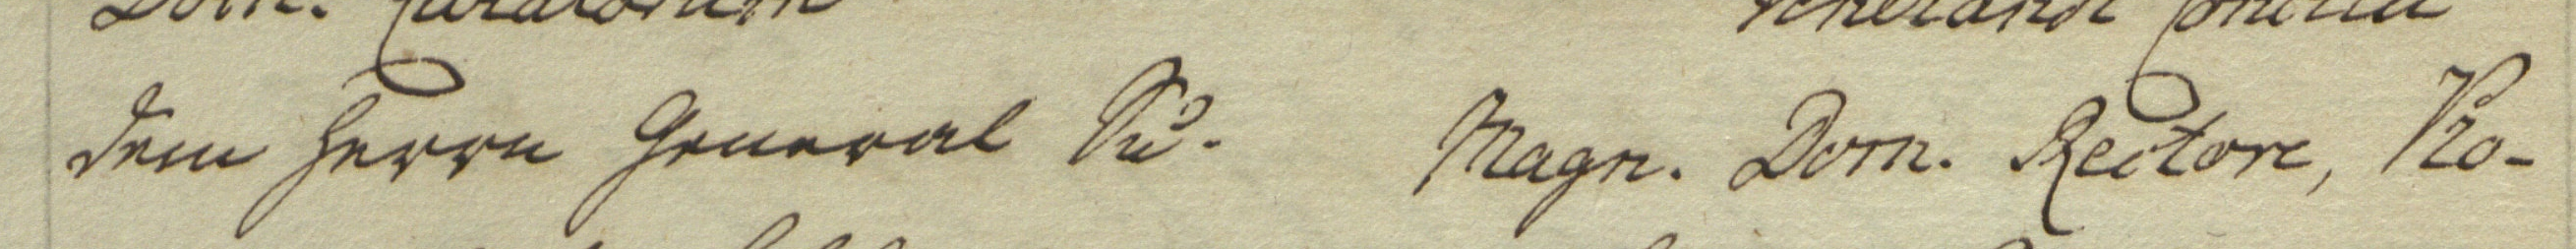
dem Herrn General Su¬ Magn. Dom. Rectore, Pro
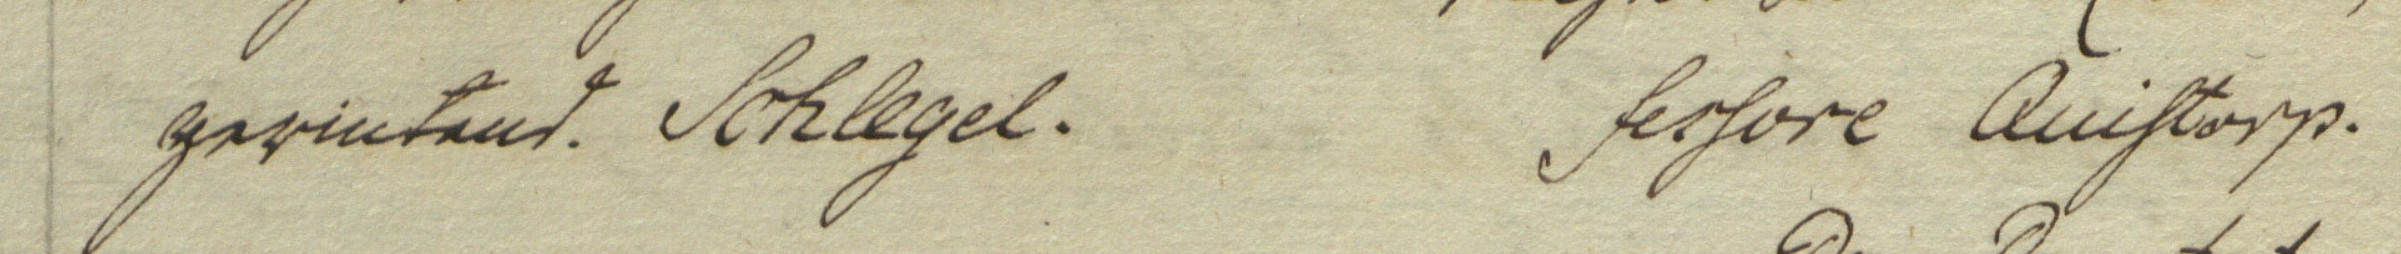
gerintend. Schlegel. fessore Quistorp.
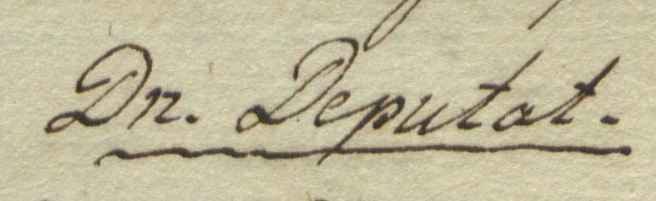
Dn. Deputat.
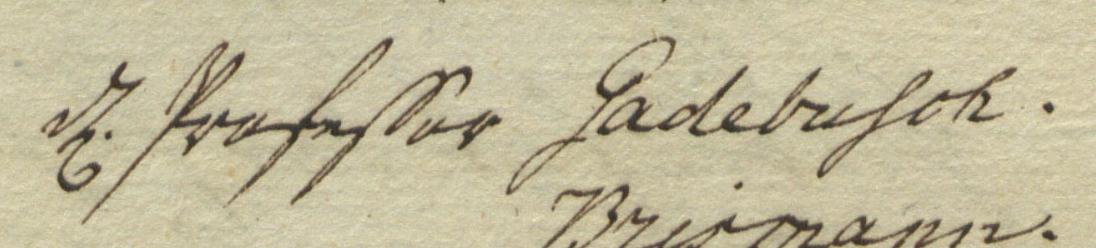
dh. Professor Gadebusch.
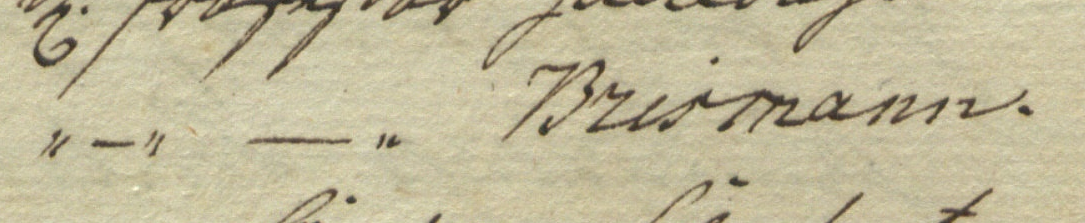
Brismann.
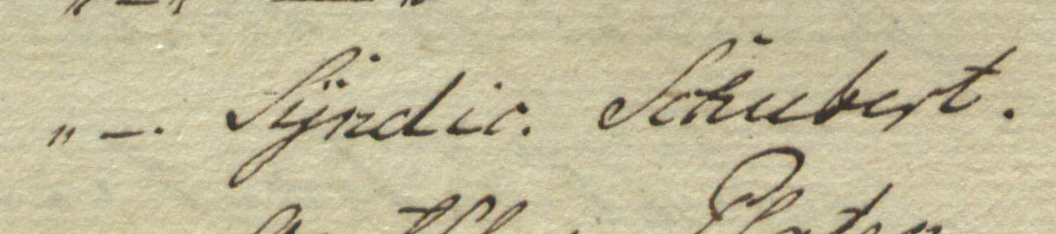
Sÿndic. Schubert.
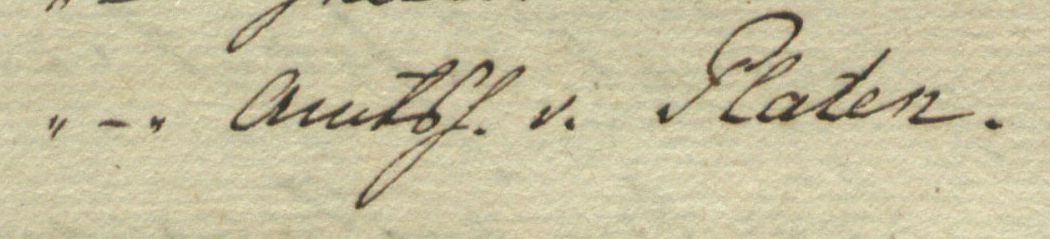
Amtsh. v. Platen.
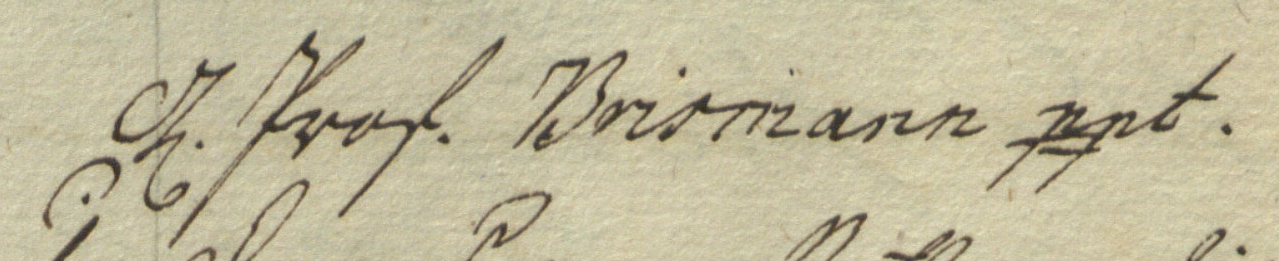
dh. Prof. Brismann ppt.
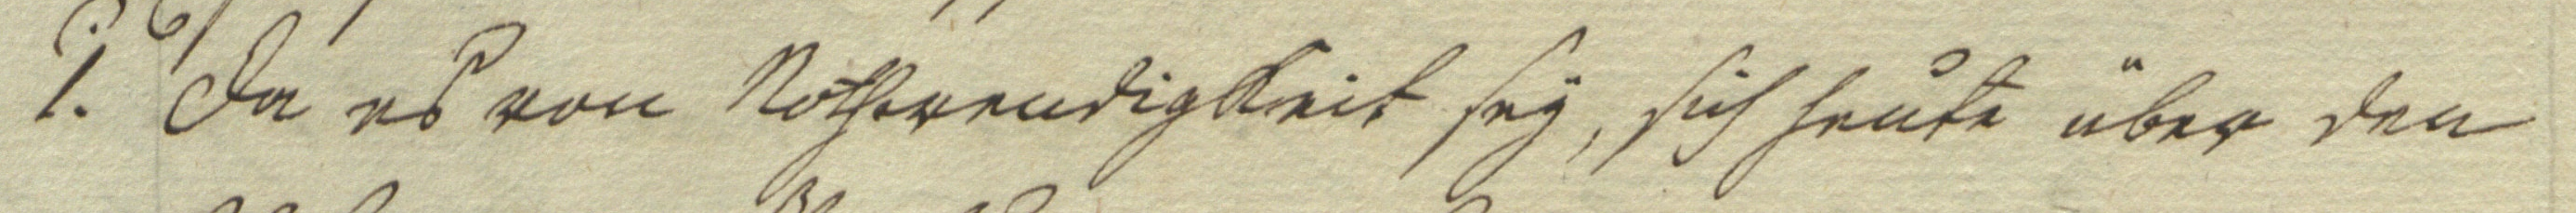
1. Da es von Nothwendigkeit seÿ, sich heute über den
